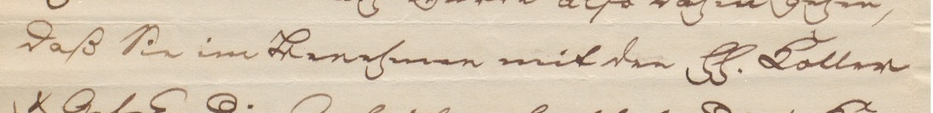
daß Sie im Benehmen mit den HH. Koller &
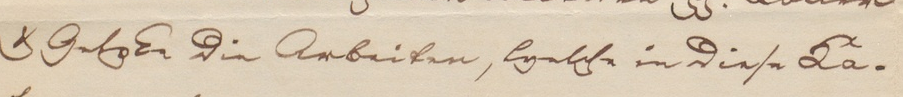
Gelpke die Arbeiten, welche in diese Ka-
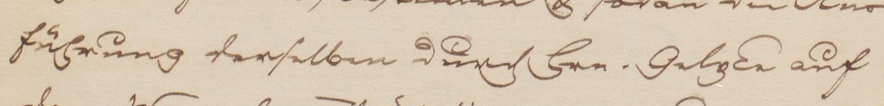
führung derselben durch Hrn. Gelpke auf
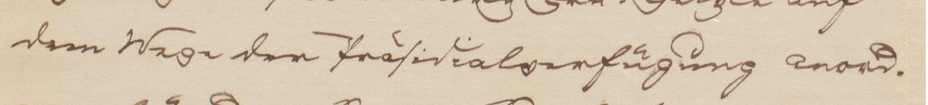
dem Wege der Präsidialverfügung anord-
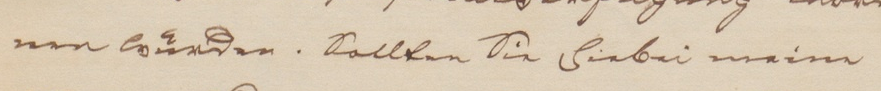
nen würden. Sollten Sie hiebei meine
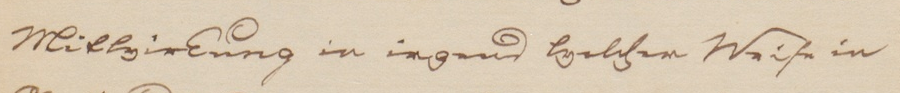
Mitwirkung in irgend welcher Weise in
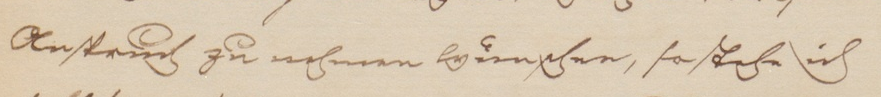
Anspruch zu nehmen wünschen, so stehe ich
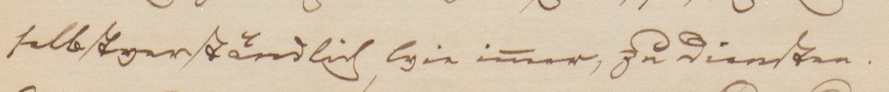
selbstverständlich, wie immer, zu Diensten.
